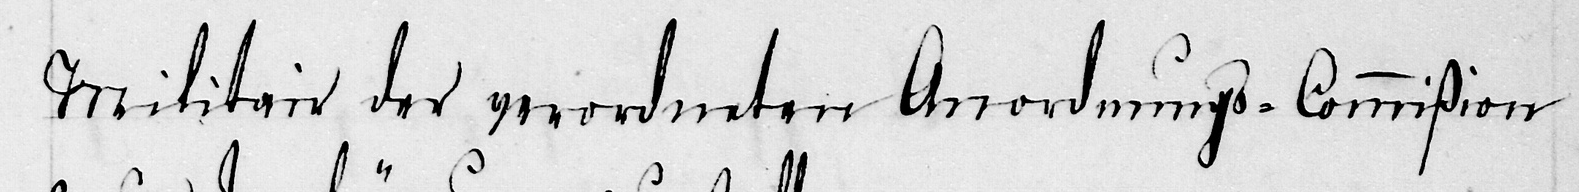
Militair der verordneten Anordnungs-Commißion
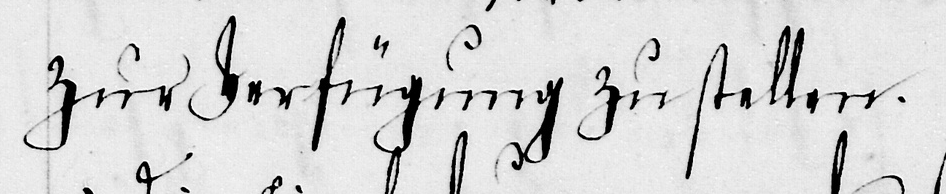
zur Verfügung zu stellen.
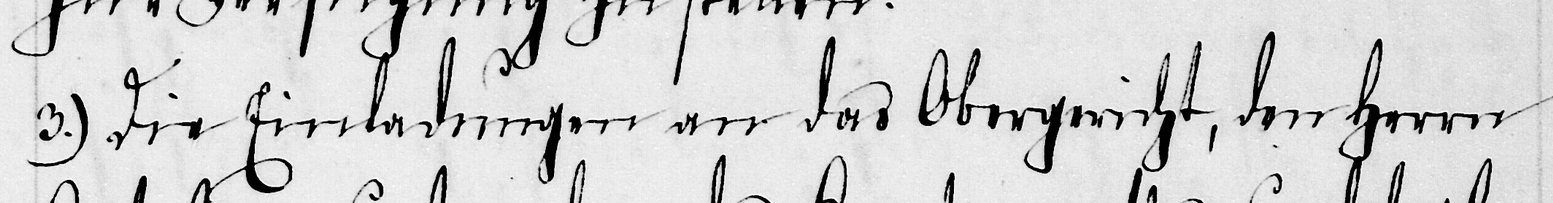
3.) Die Einladungen an das Obergericht, den Herrn
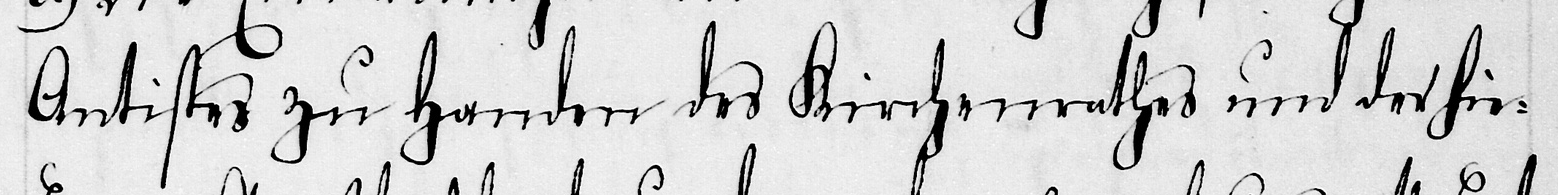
Antistes zu Handen des Kirchenrathes und der hie¬
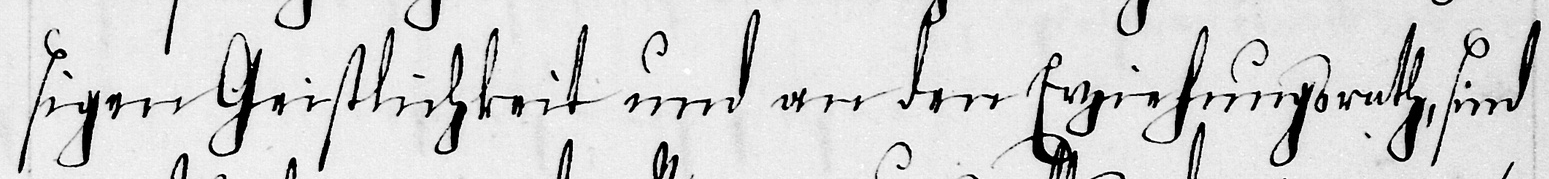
sigen Geistlichkeit und an den Erziehungsrath, sind
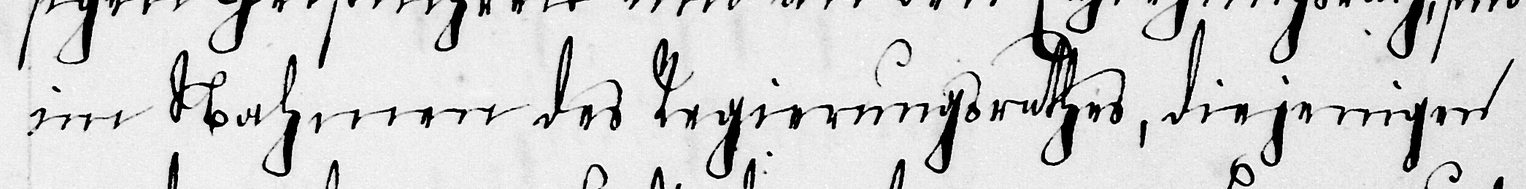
im Nahmen des Regierungsrathes, diejenigen
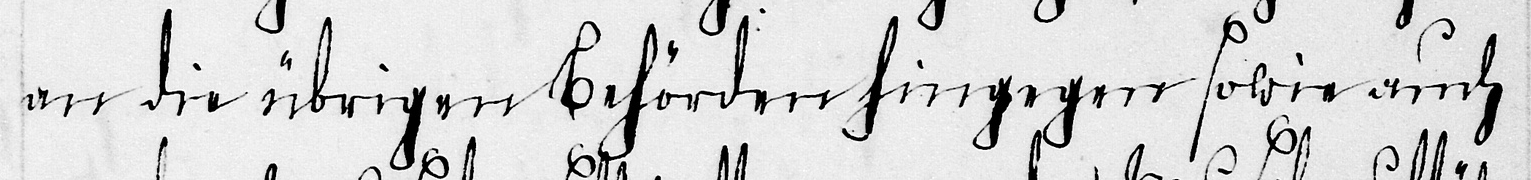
an die übrigen Behörden hingegen sowie auch
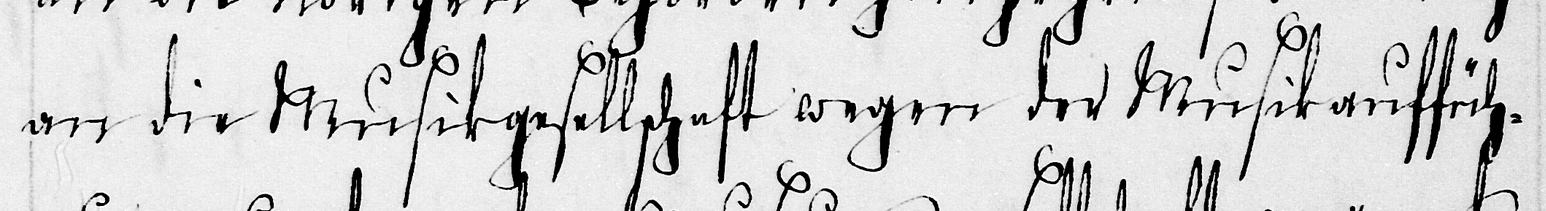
an die Musikgesellschaft wegen der Musikauffüh¬
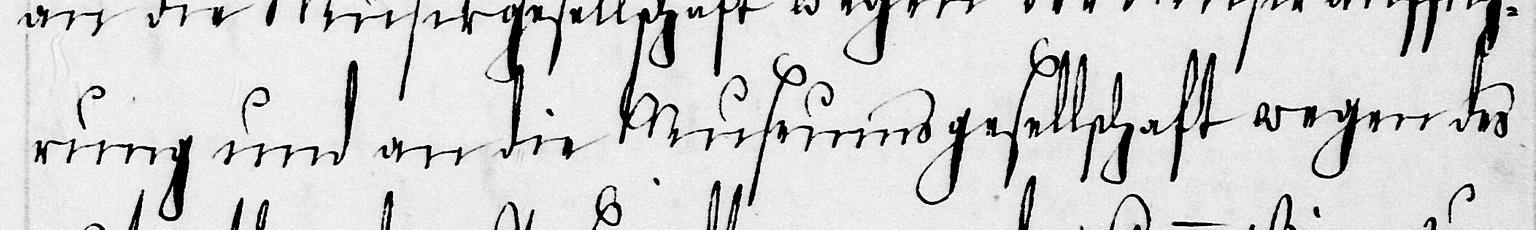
rung und an die Museumsgesellschaft wegen des
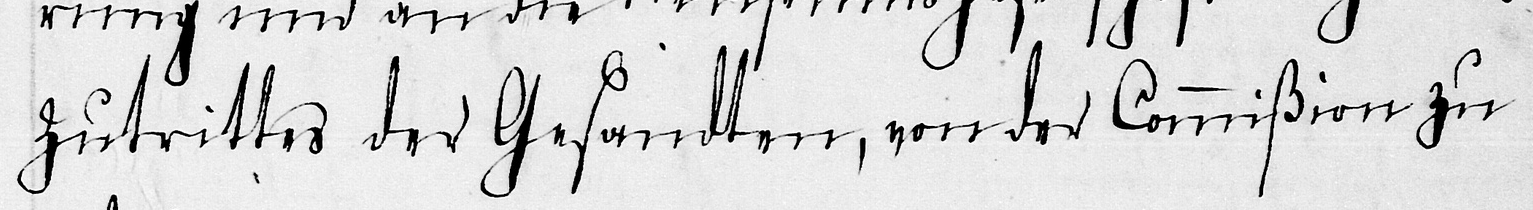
Zutrittes der Gesandten, von der Commißion zu
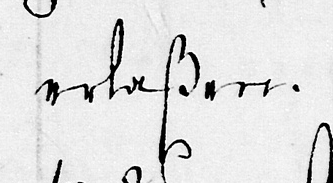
erlaßen.
